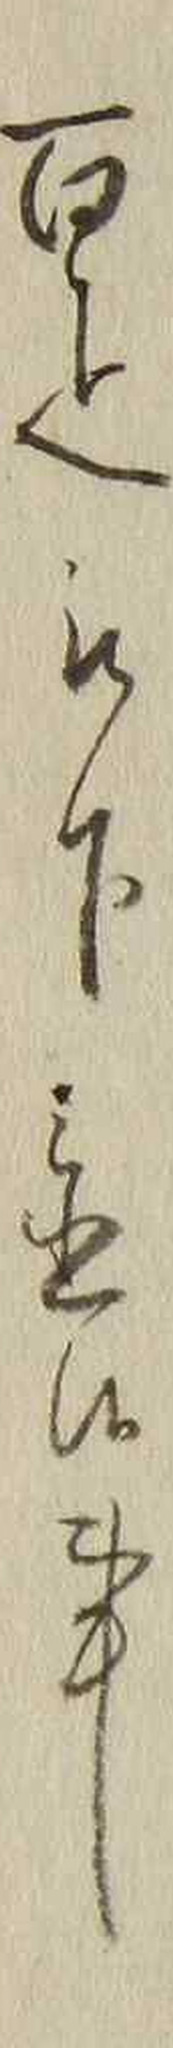百疋被下置候事
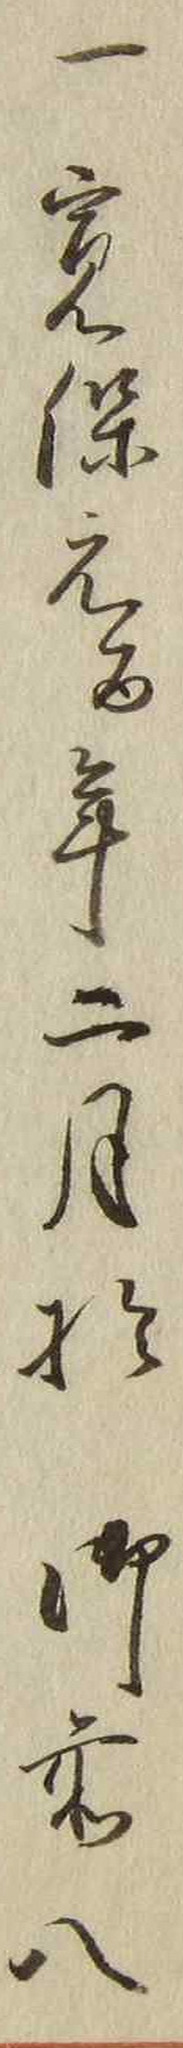一寛保元酉年二月於御前八
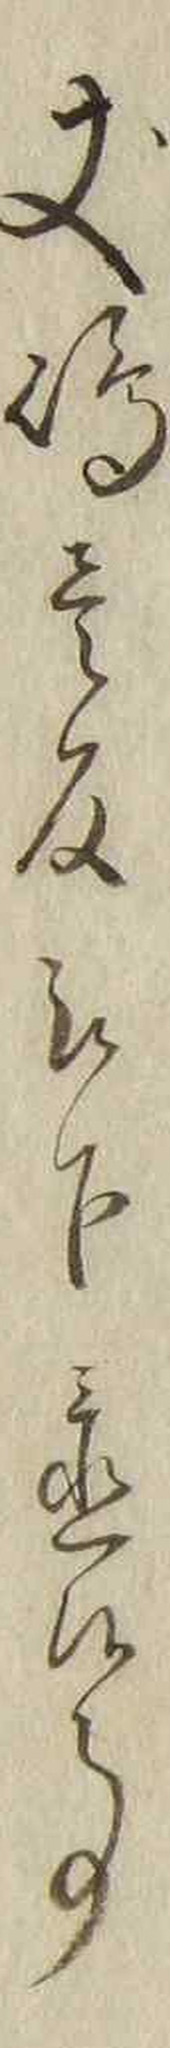丈嶋壱反被下置候事

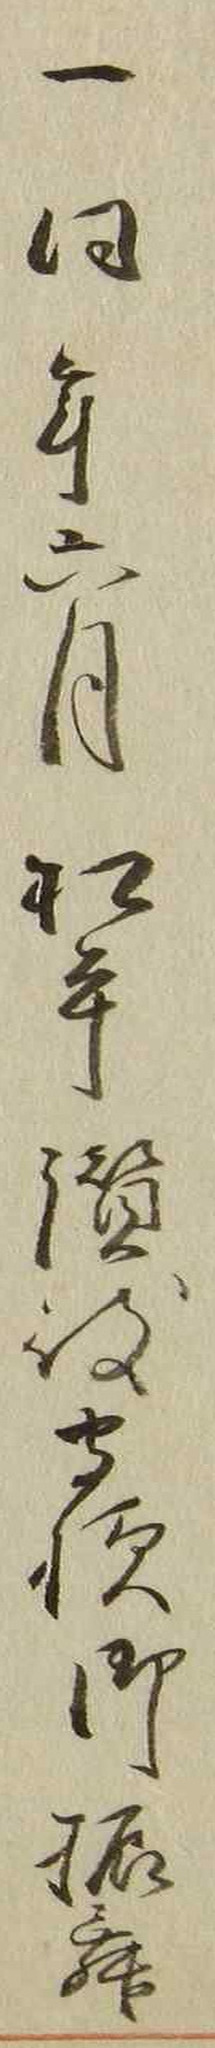一同年六月松平讃岐守様御振舞
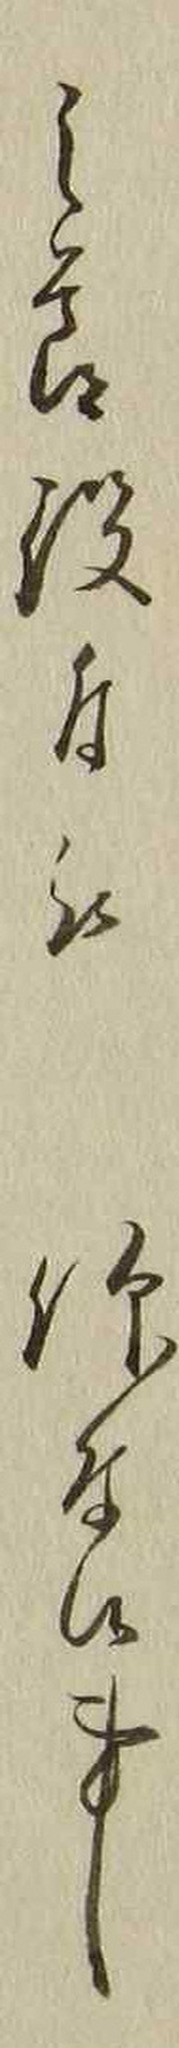之節役付被仰付候事
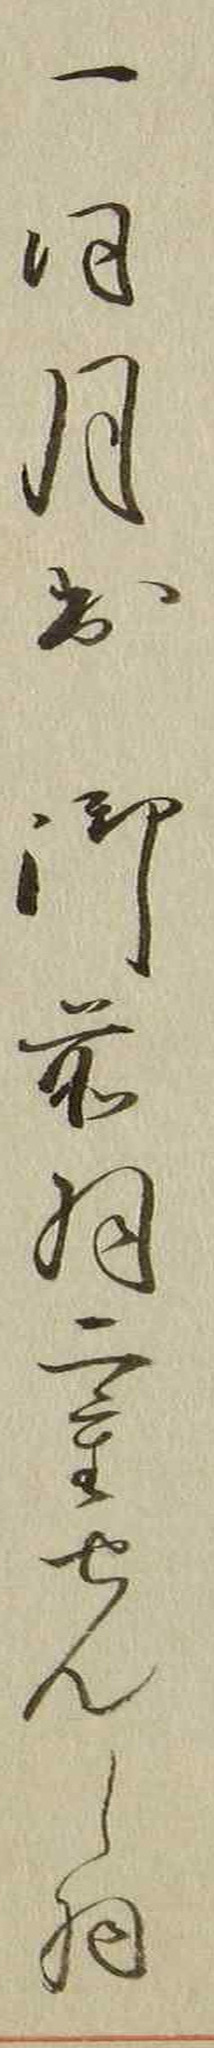一同月於御前羽二重せんし羽
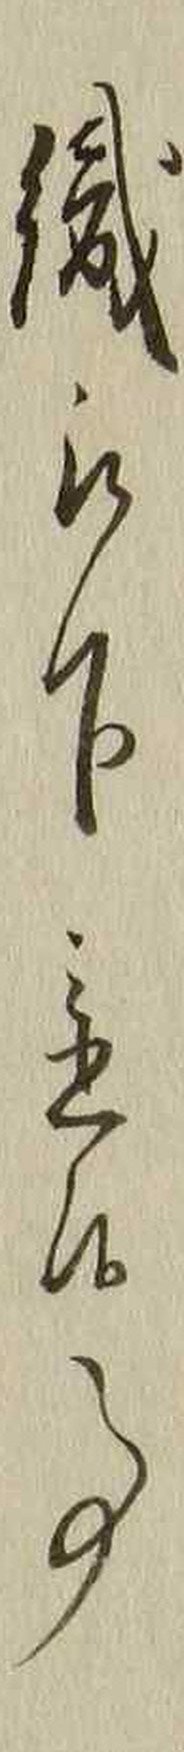織被下置候事
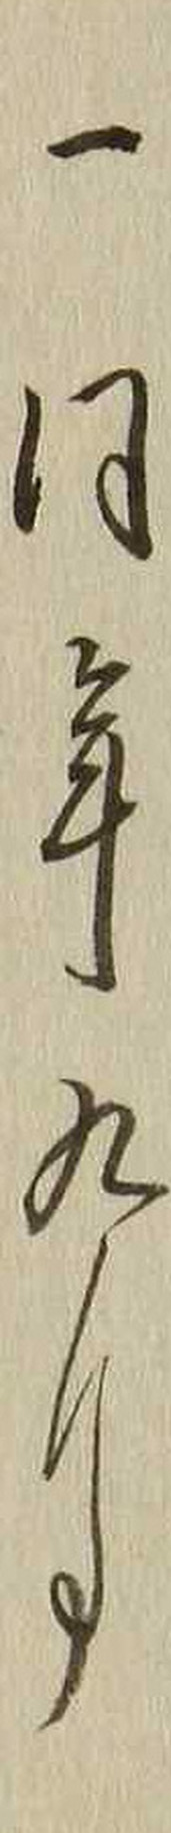一同年九月
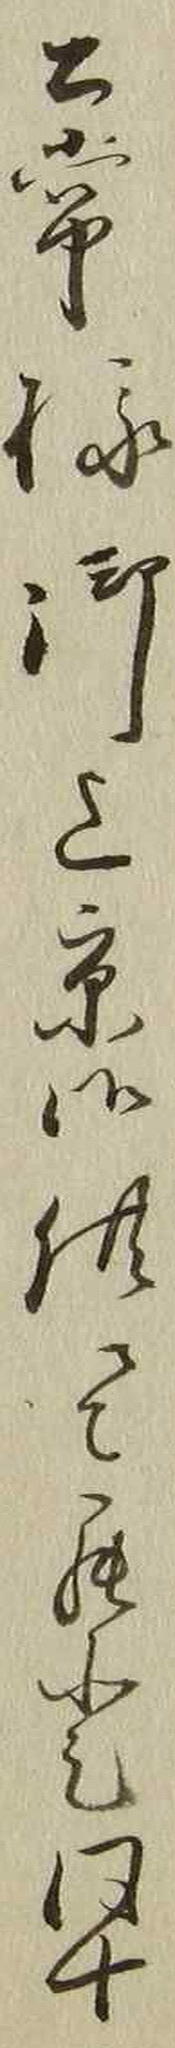土常様御上京御供ニ而罷登同十
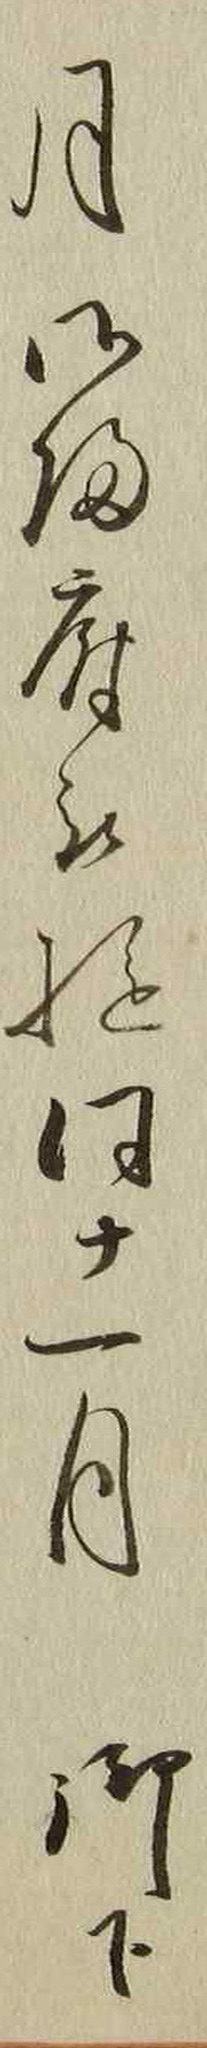月御帰府被遊同十一月御下
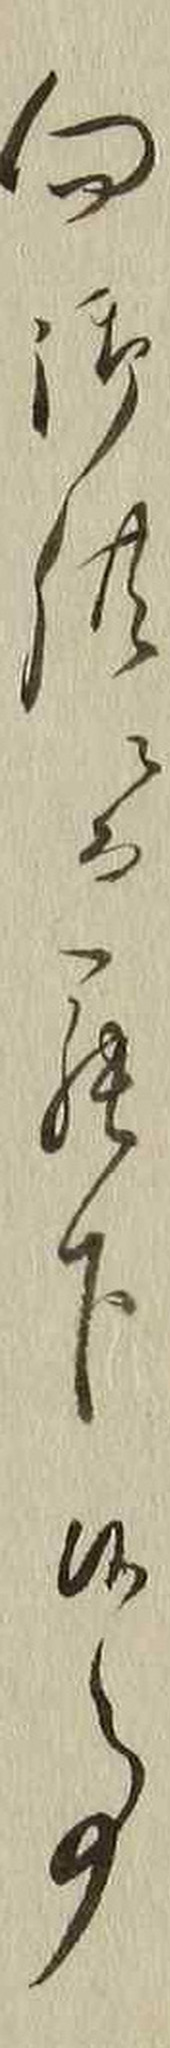向御供ニ而罷下候事
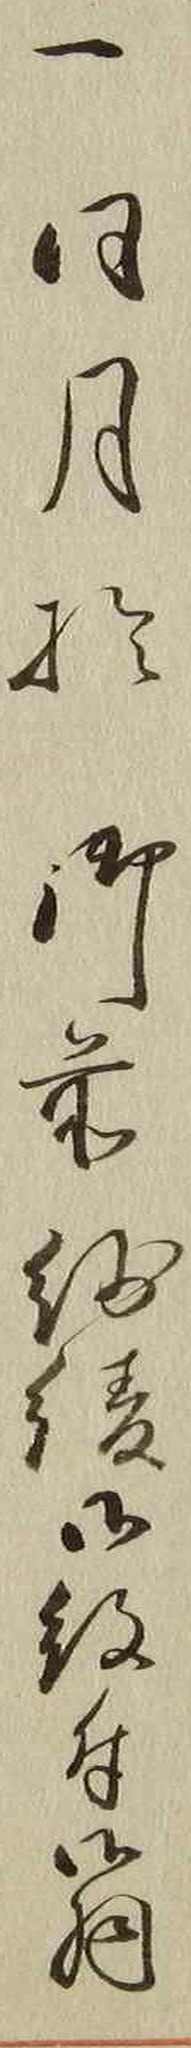一同月於御前紗綾御紋付御羽
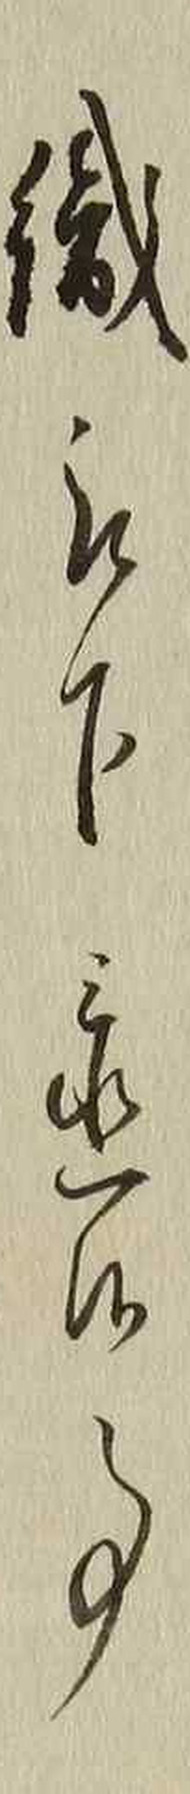織被下置候事
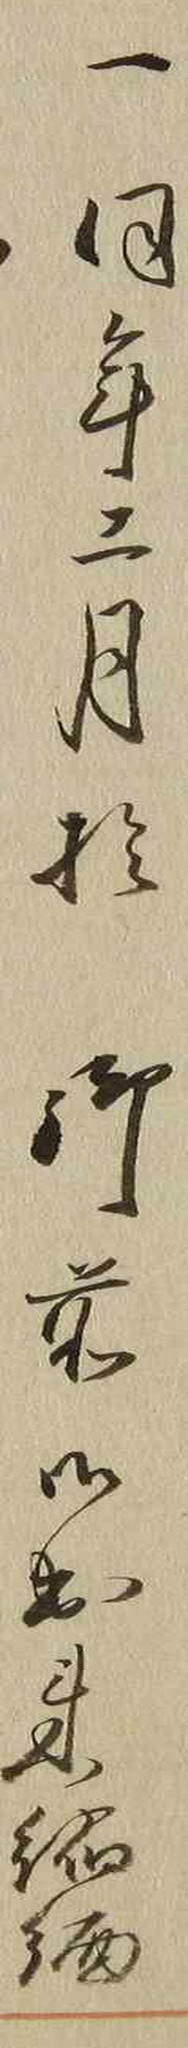一同年三月於御前御出来縮緬
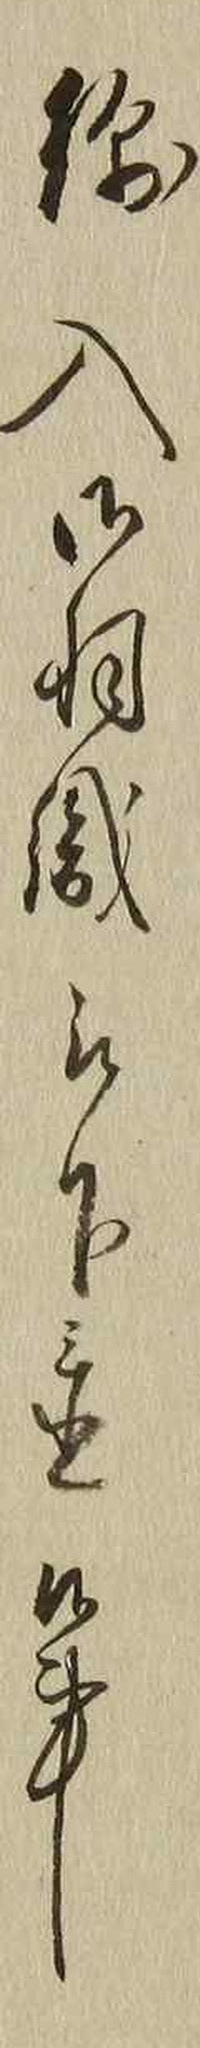綿入御羽織被下置候事
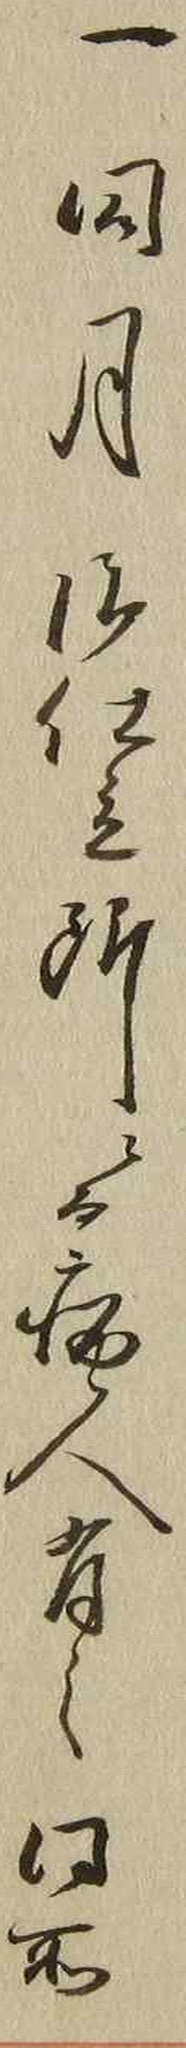一同月御仕立所ニ而病人有之同所
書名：諸士系譜　巻之68　を之部2
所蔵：会津若松市立会津図書館
